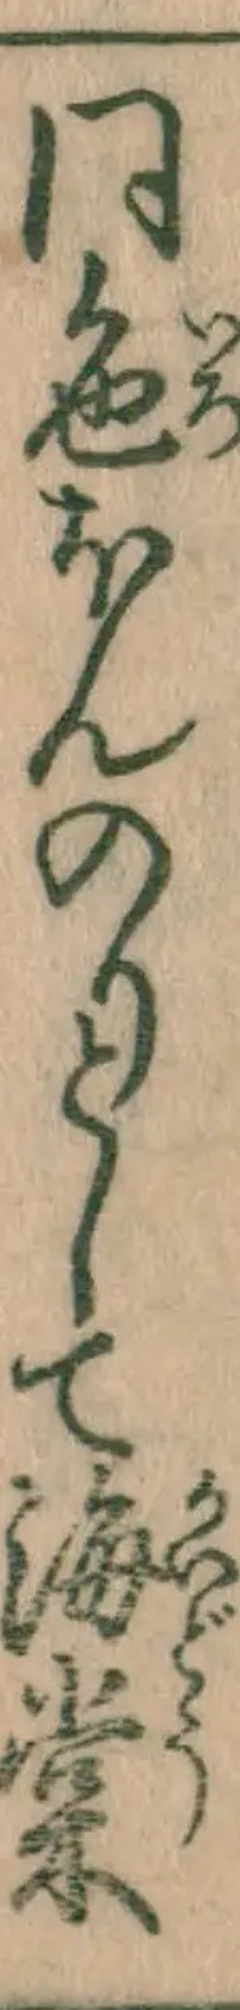同色ほんのりとして海棠
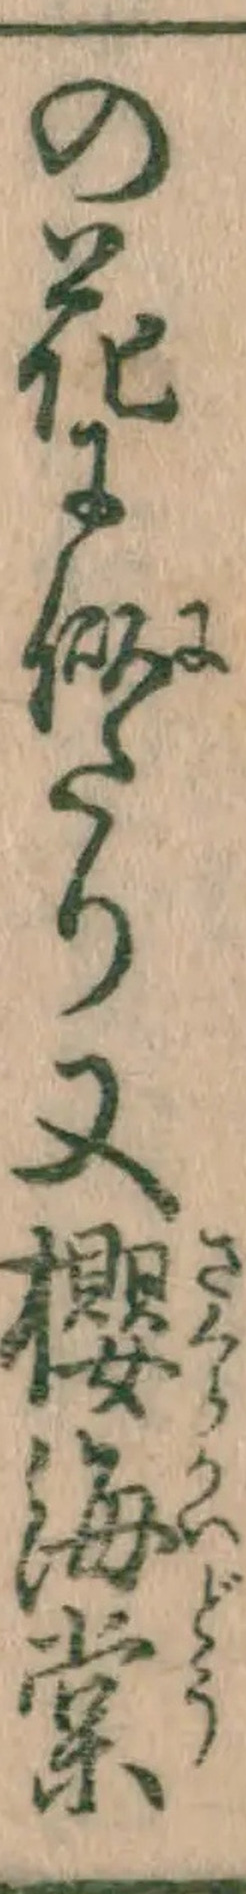の花に似たり桜海棠
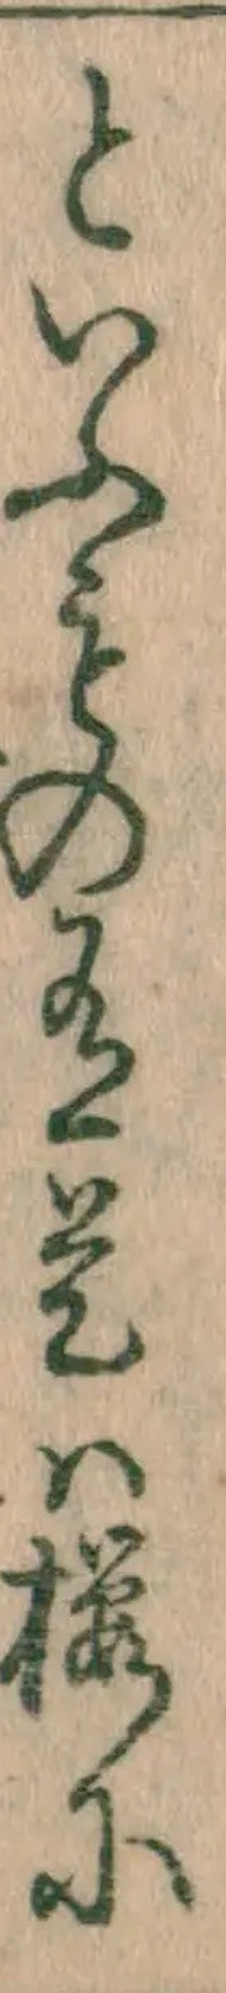といふもの有是は桜に
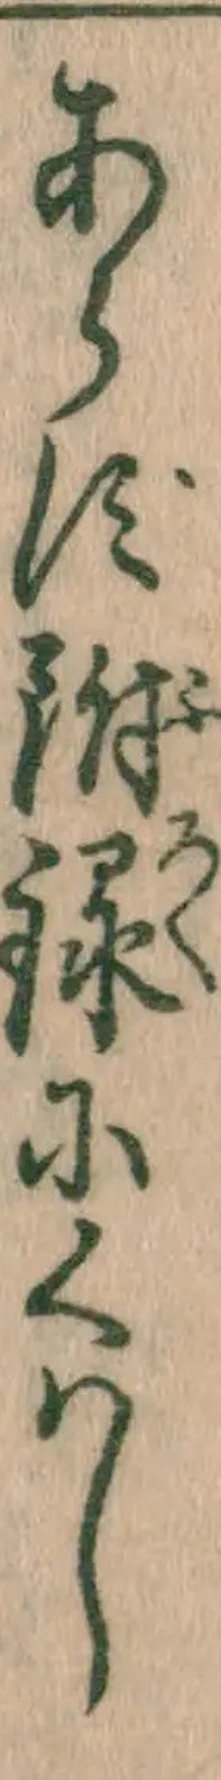あらす附録にくはし
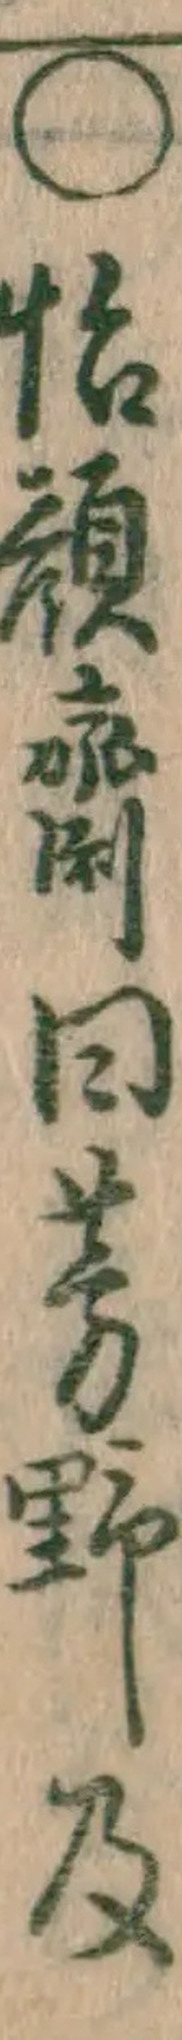○怡顔斎曰芳野及
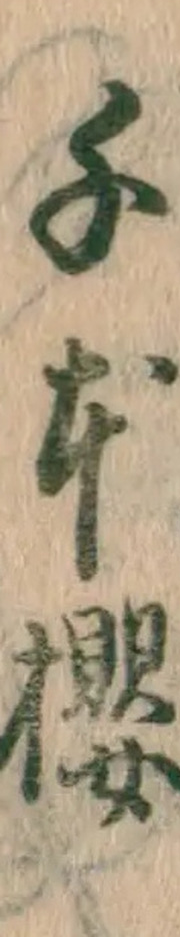千本桜
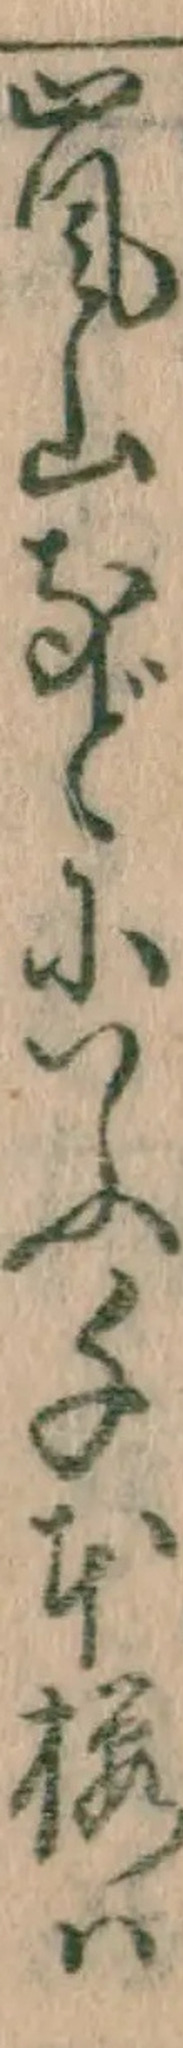嵐山などにいふ千本桜は
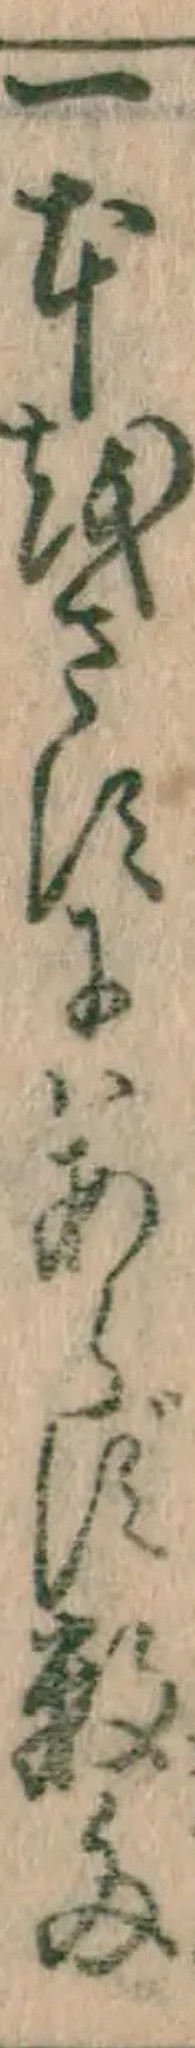一本をさすにはあらず数多
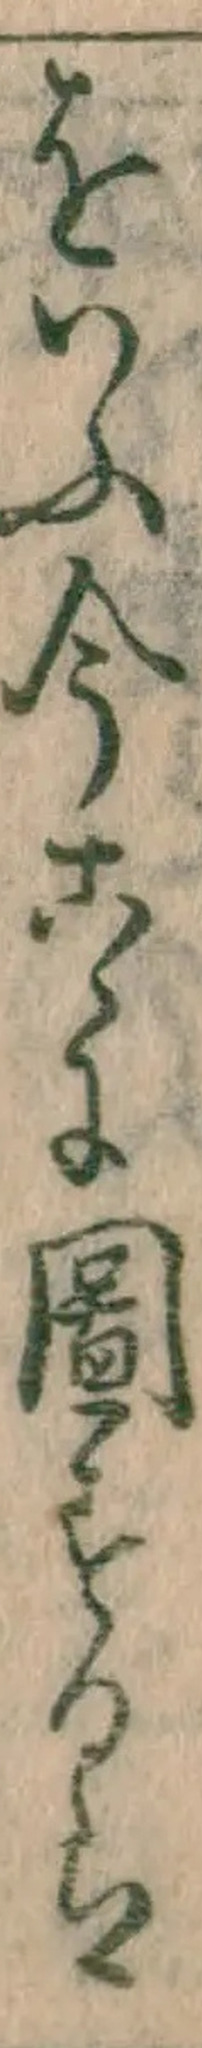をいふ今こゝに図するは
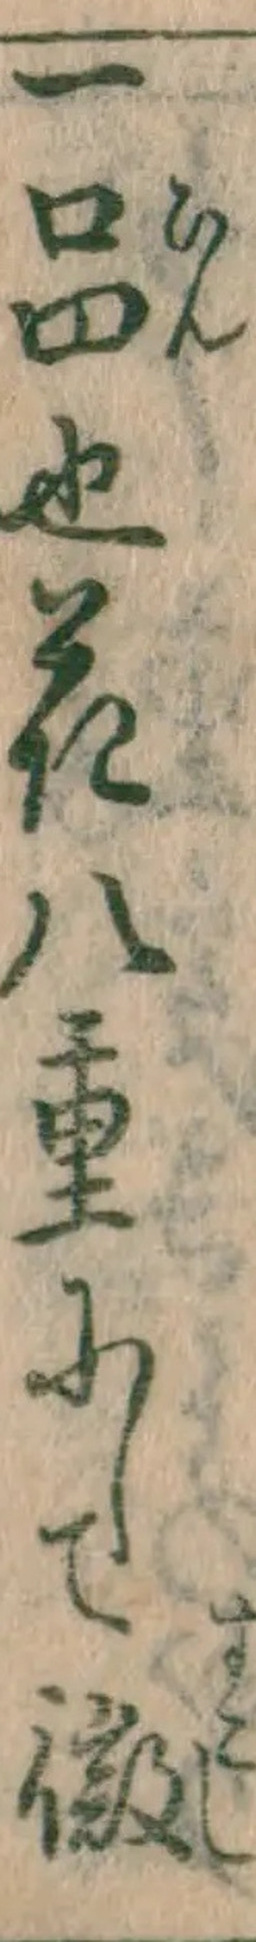一品也花八重にして微
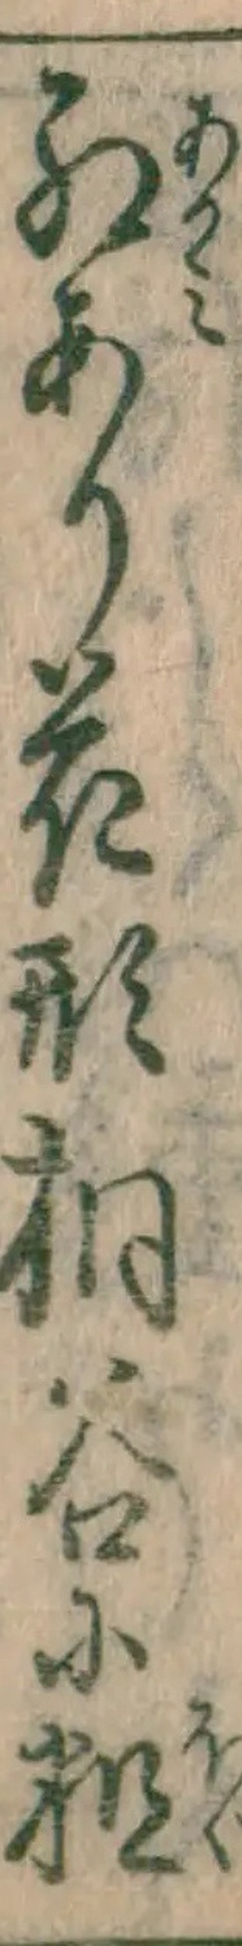紅あり花形桐谷に粗
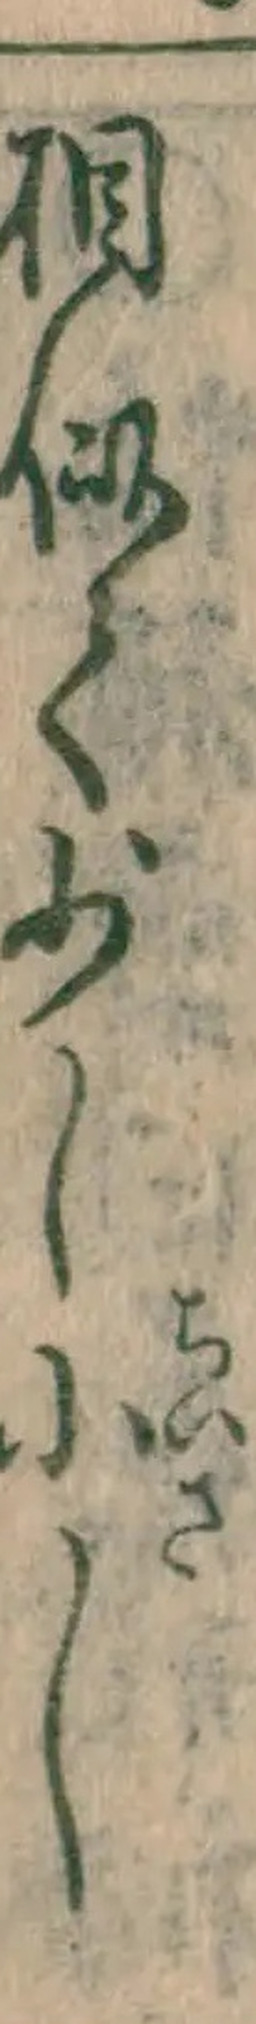相似て少し小し

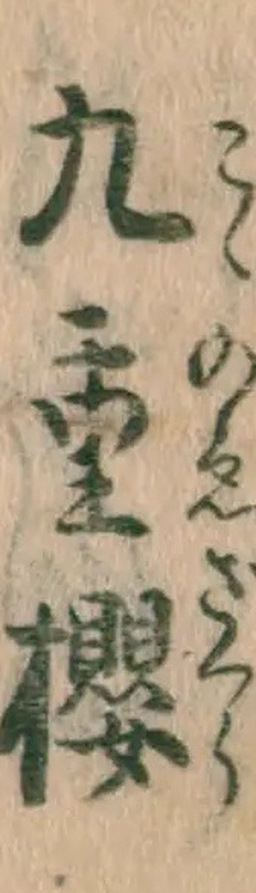九重桜
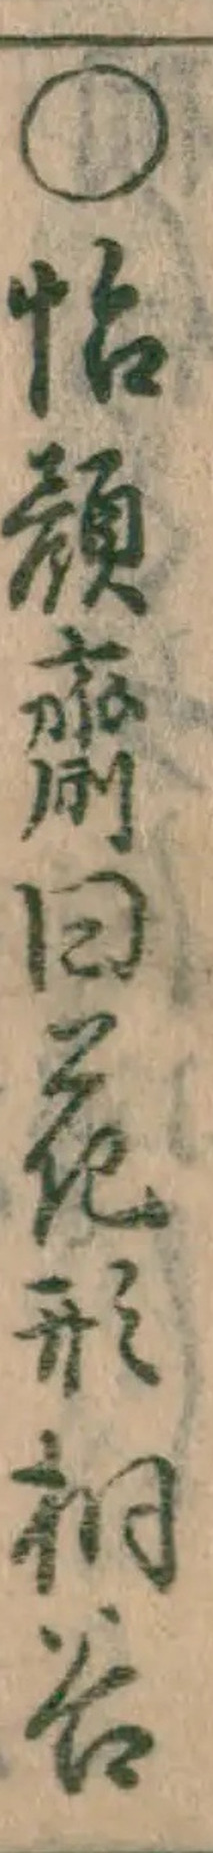○怡顔斎曰花形桐谷
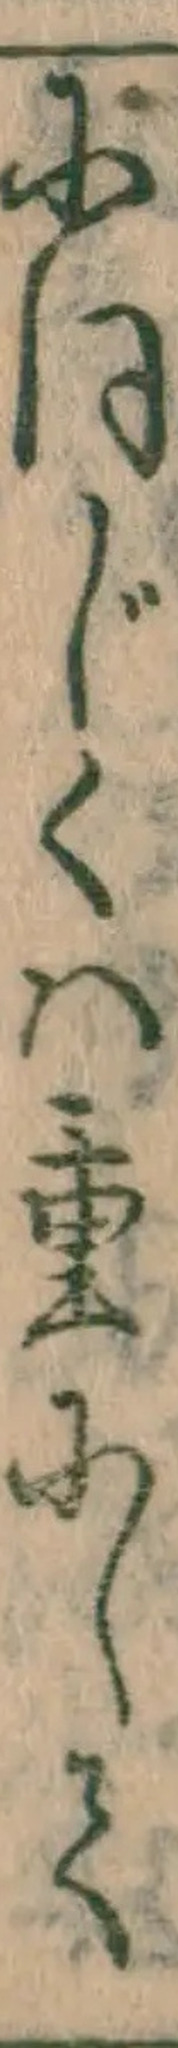に同じく八重にして
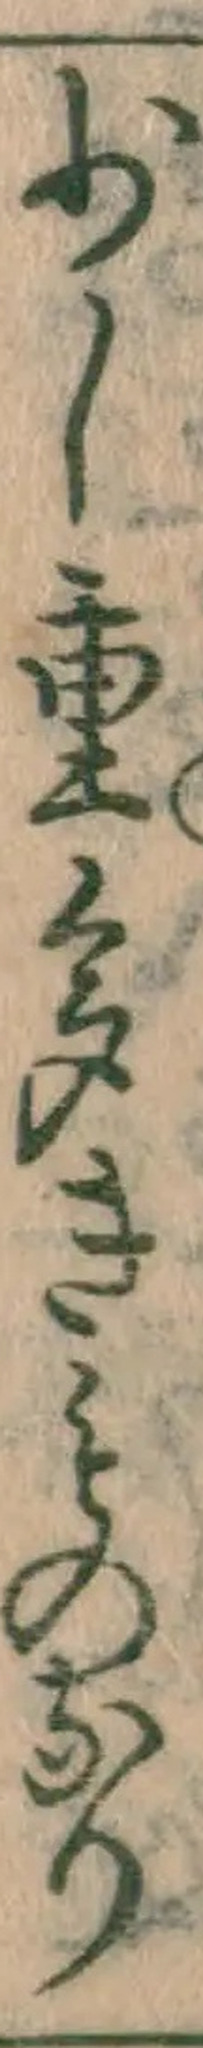少し重多きものなり
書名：怡顔齋櫻品
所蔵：国立国会図書館 National Diet Library, JAPAN
